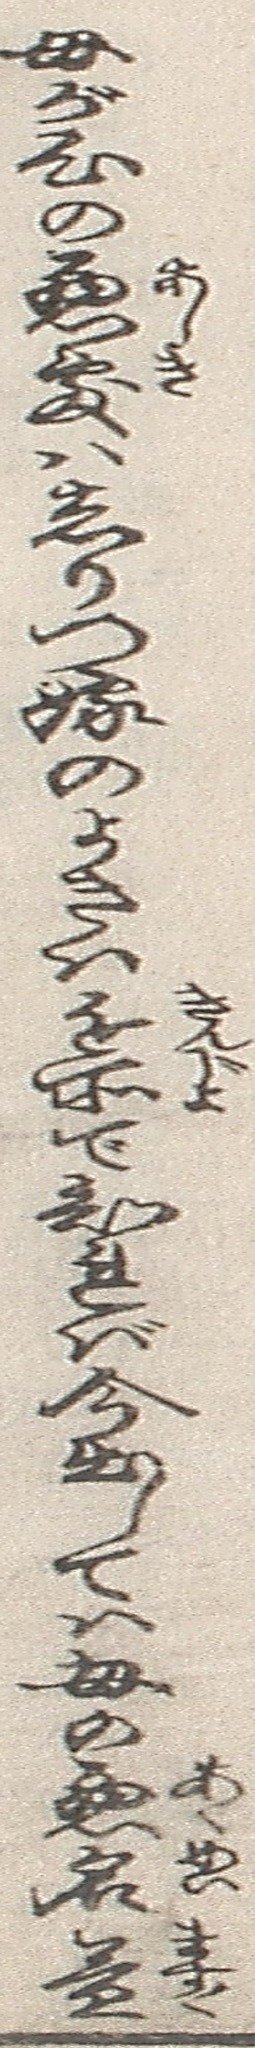母が心の悪敷ハしりつ嫁のよきハ近所で知れバ今出してハ母の悪名益
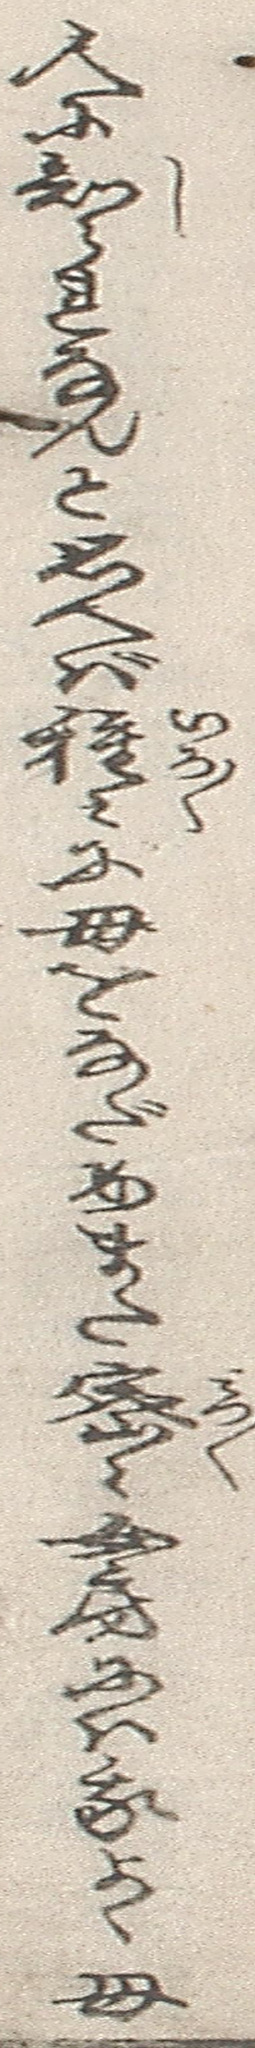人に知られなんと思へバ種々に母をなだめまた密々女房にハ我よく母
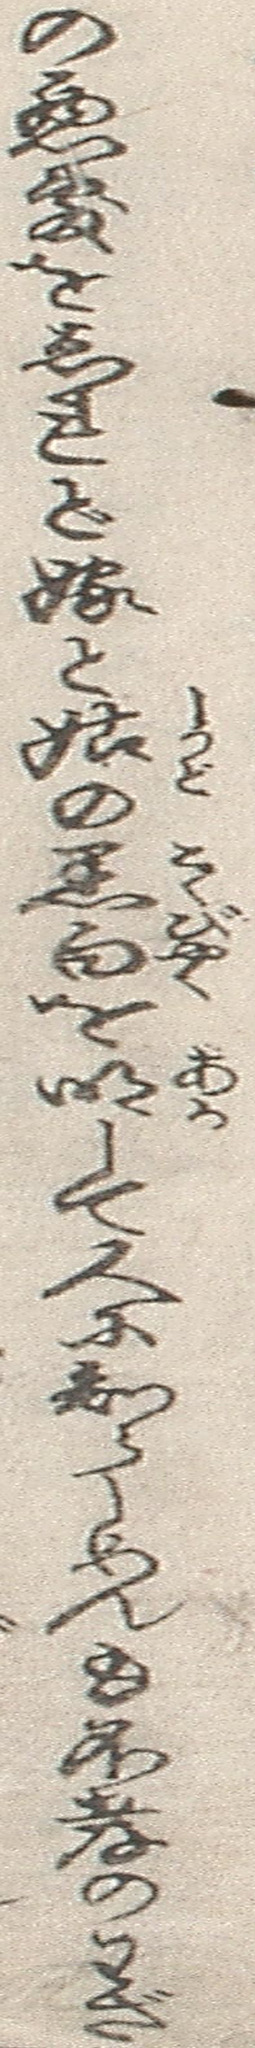の悪敷をしれど嫁と姑の黒白を明して人に知らしめんも不孝のわざ
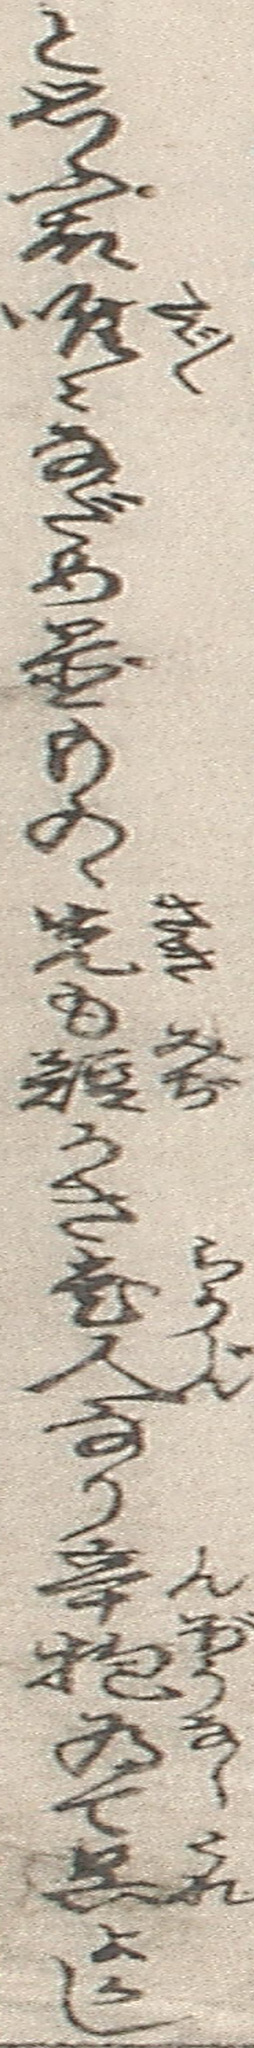と思ふ故唯々なだめ置ものゝ先も短かき老人なり辛抱為て呉よかし

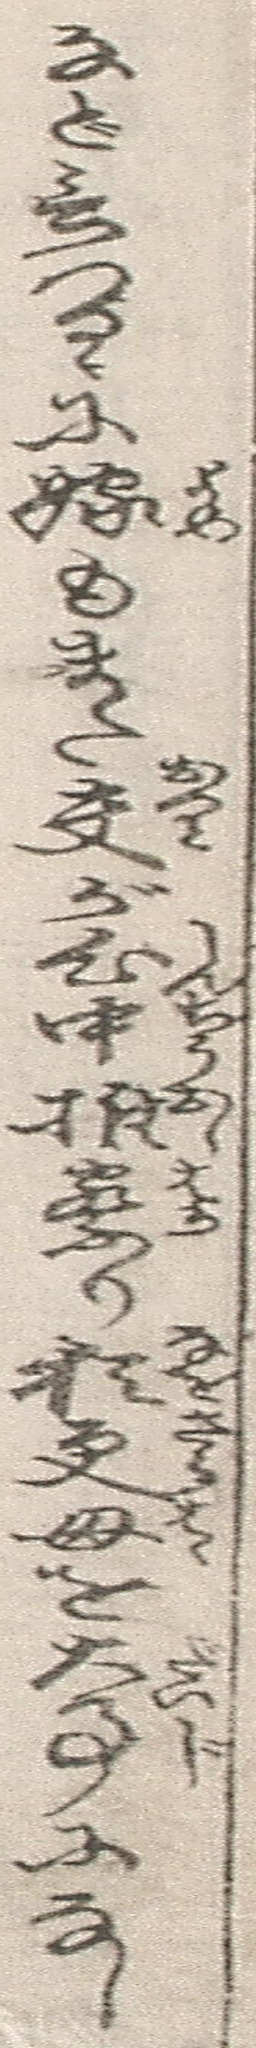など言つるゝに嫁もまた夫が心中推察り尚更母を大事になし
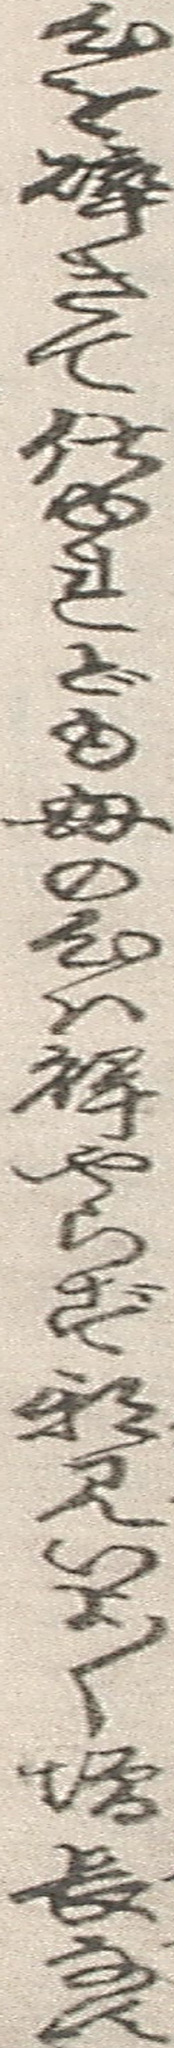心を砕きて仕ゆれども母の心ハ解やらず邪見いよ〳〵増長なす
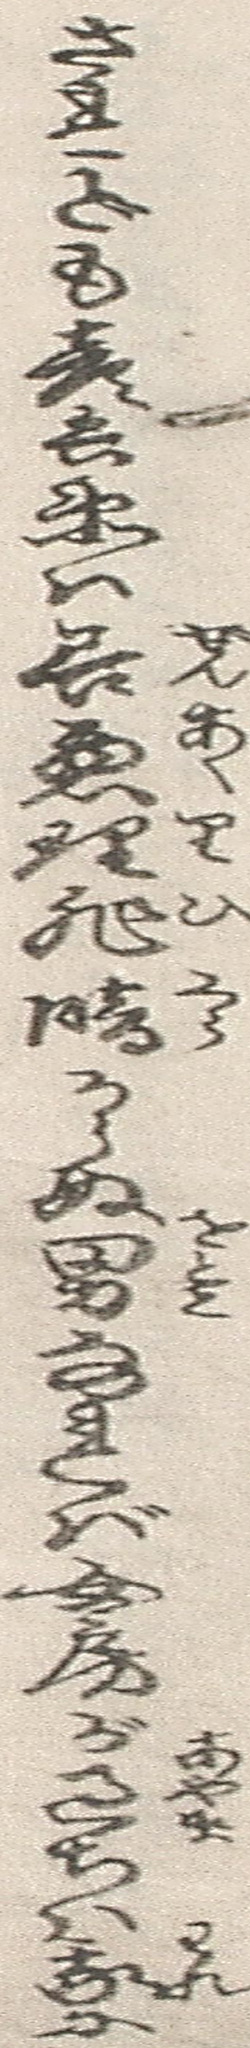されども彦兵衛ハ善悪理非晴からぬ男なれバ女房が過ちハ我に
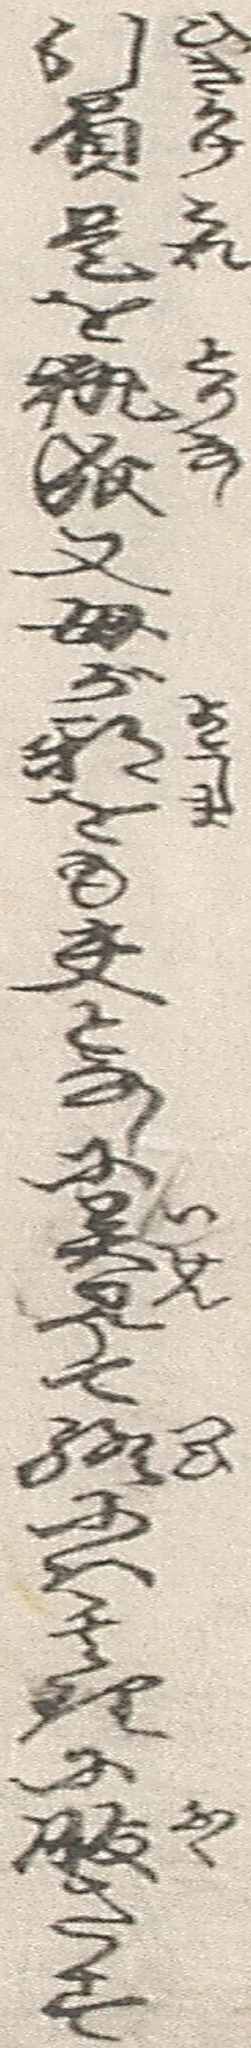引負是を執成又八母が邪をも夫となしに異見して終にハ其理に服さす
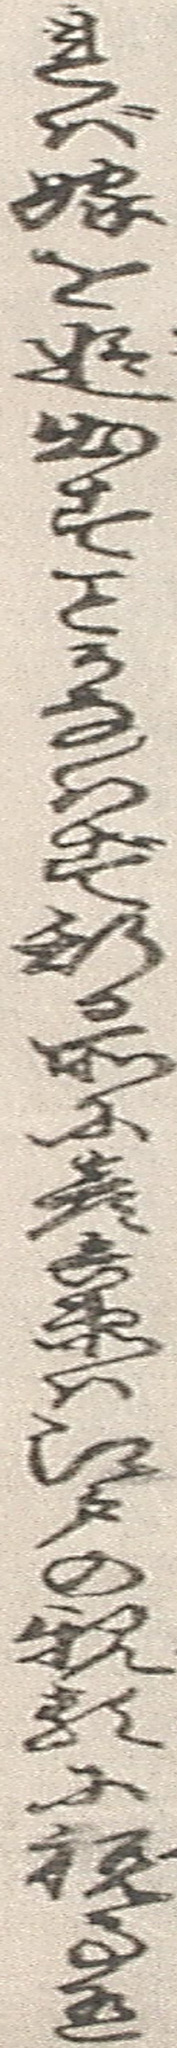れバ嫁を追出すことかなハず斯る所に彦兵衛ハ江戸の親類に祝事有
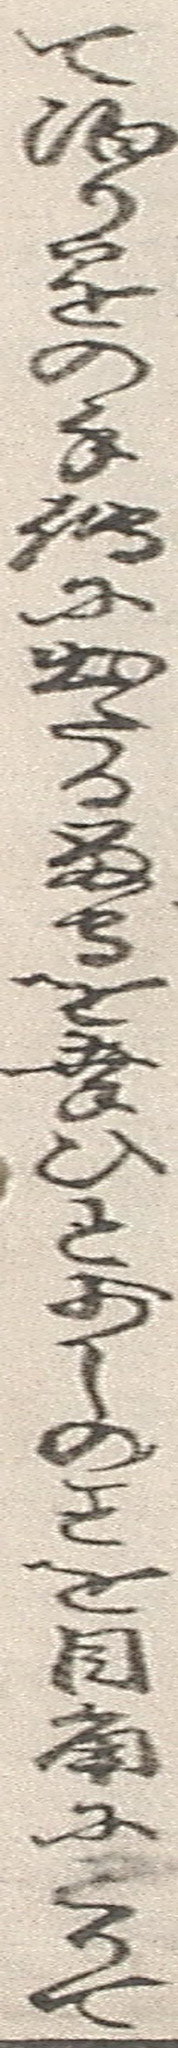て泊り懸の手伝に出たる留守を幸ひと少しの事を目角にとりて
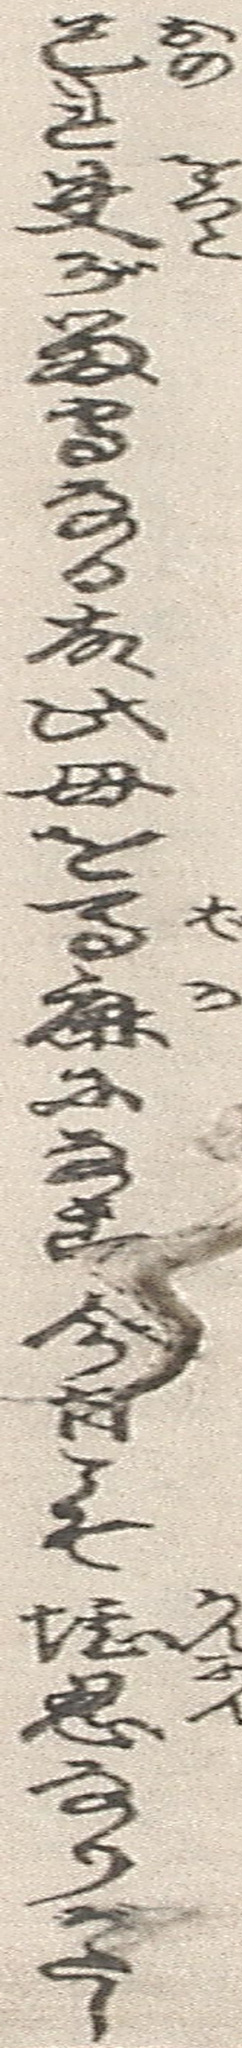己れ夫が留守なる故此母を馬鹿になす今日こそ堪忍なりかたし
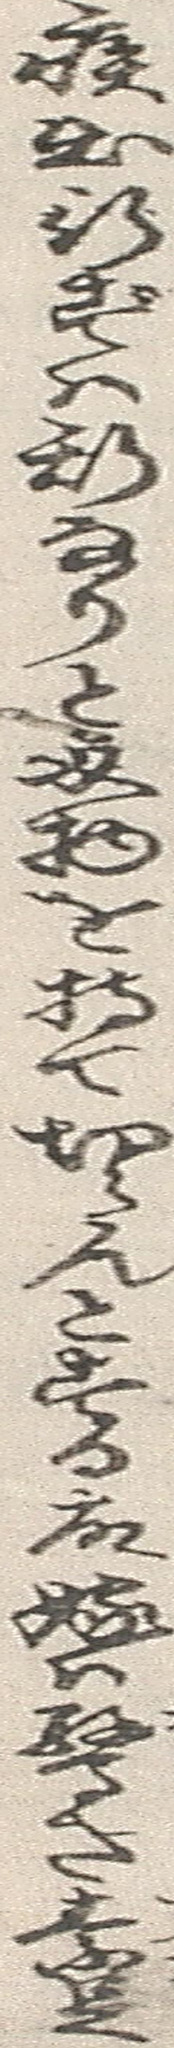疾出行ずハ斯なりと刃物を持て切らんとする故嫁ハ驚き素足
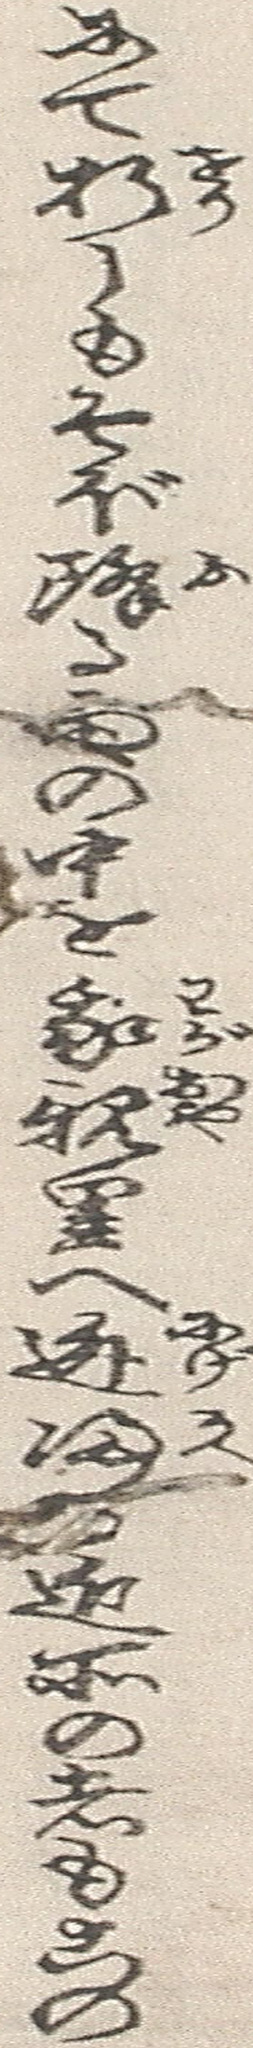にて折しもそぼ降る雨の中を我親里へ逃帰り近所の者もこの
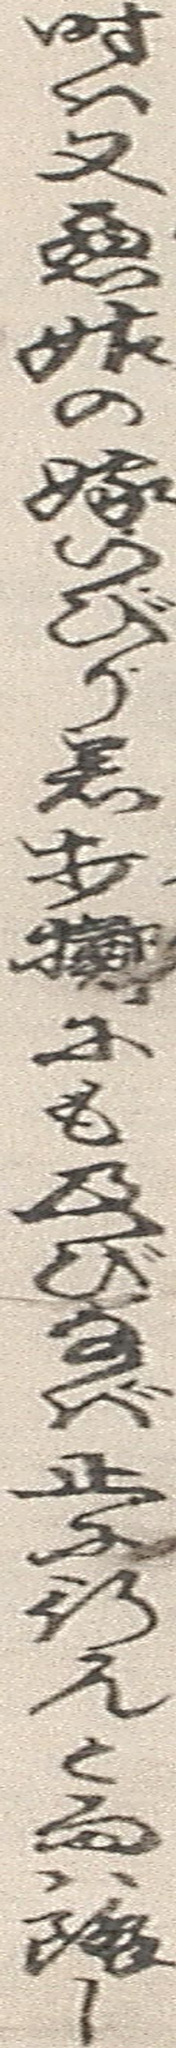時ハ又悪姑の嫁いびり若打擲にも及びなバ止に行んと雨ハ降し
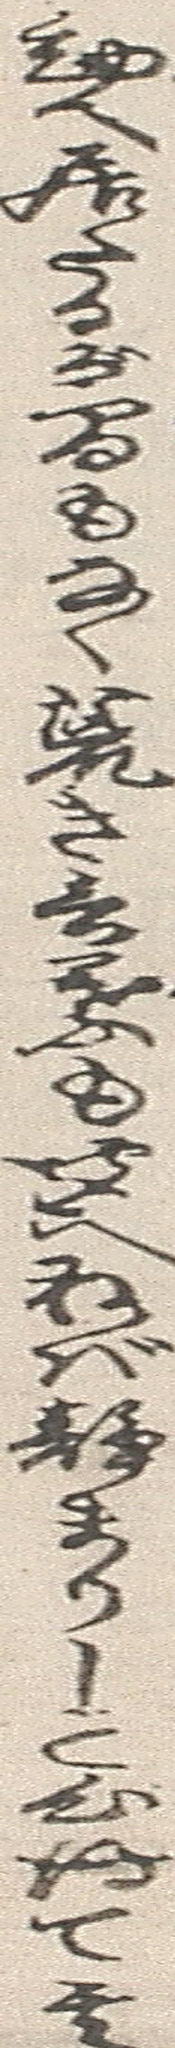勘へ居たるが間もなく荒き言葉も聞へねバ静まりしこと心得て其
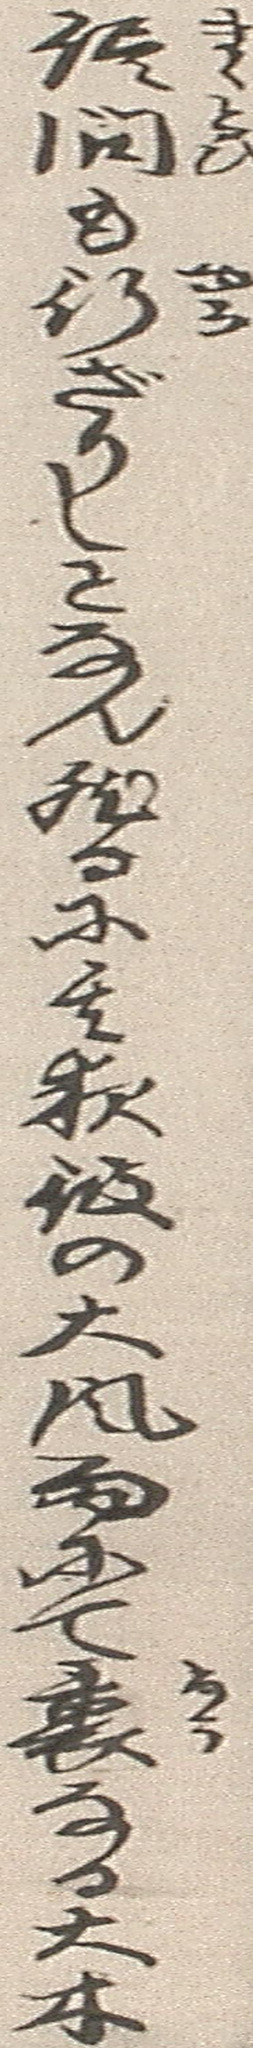侭問も行ざりしとなん然るに其夜彼の大風雨にて裏なる大木
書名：安政風聞集　上中下　全
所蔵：東京大学地震研究所図書室 Earthquake Research Institute Library, The University of Tokyo, JAPAN
